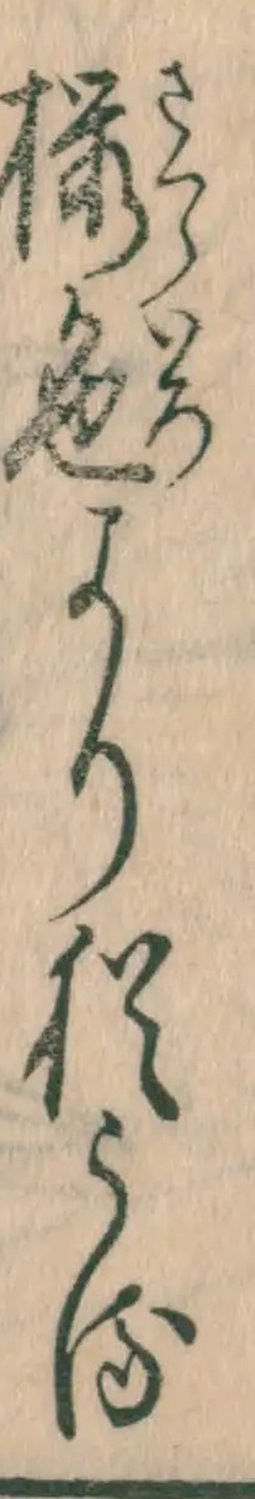桜色より猶うる
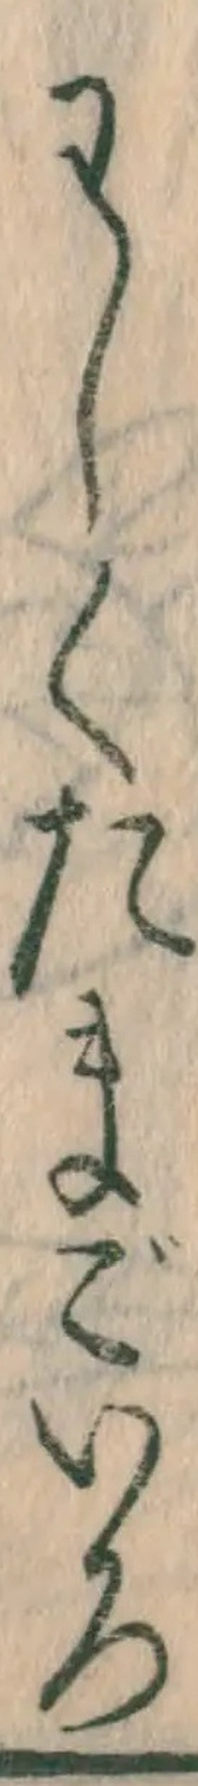わしくたまごいろ
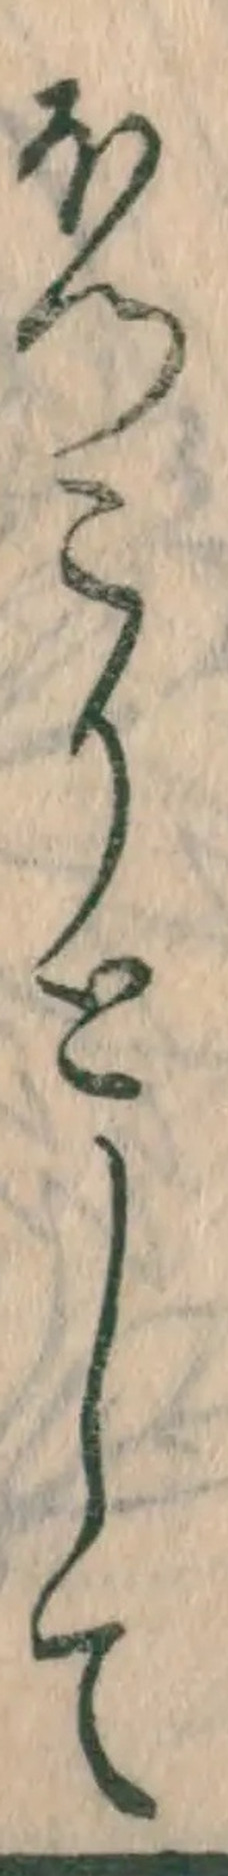ほつこりとして
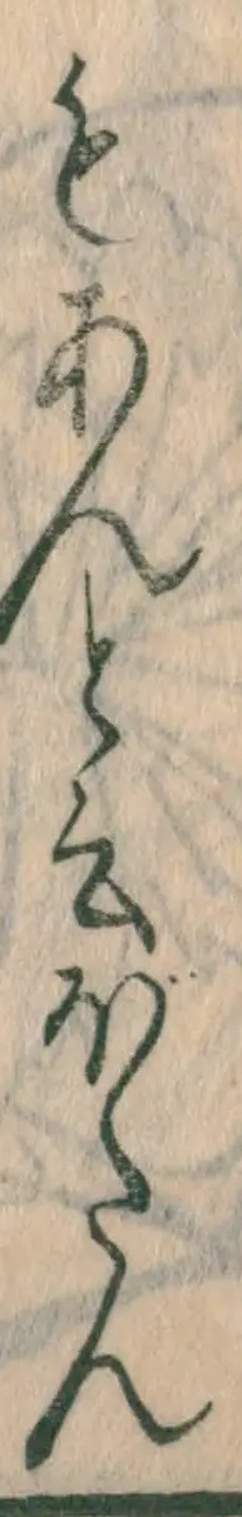もあんと云ぼたん
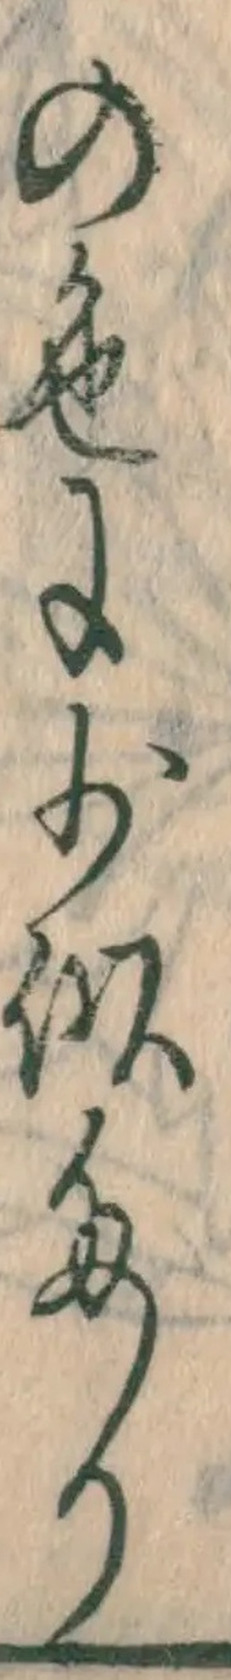の色に少似たり
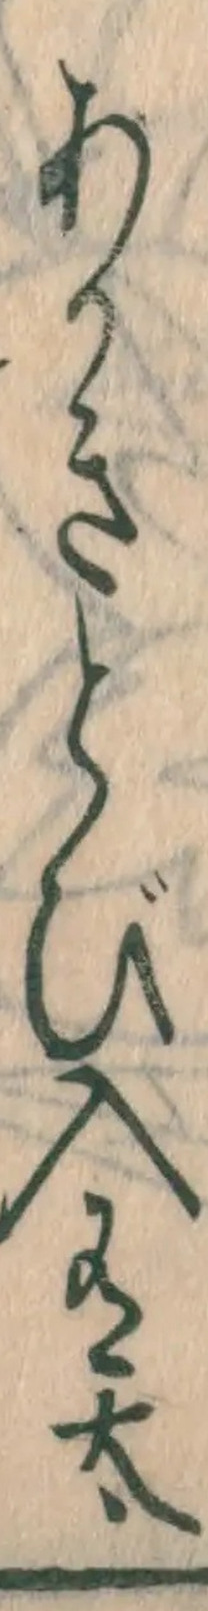あかきとび入有太

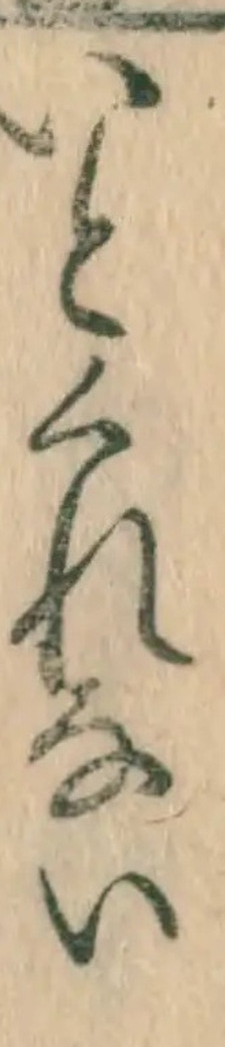●いとくれない
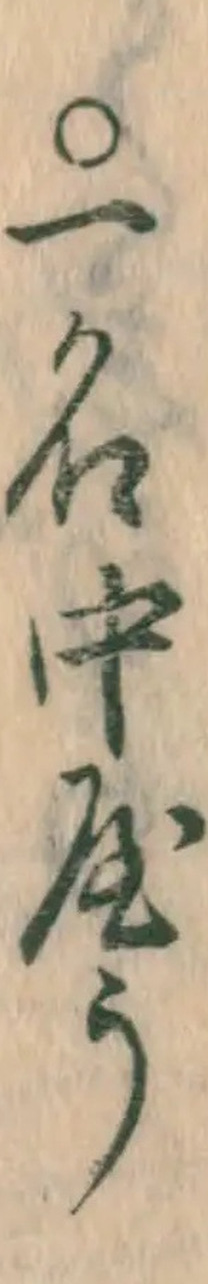○一名中やう
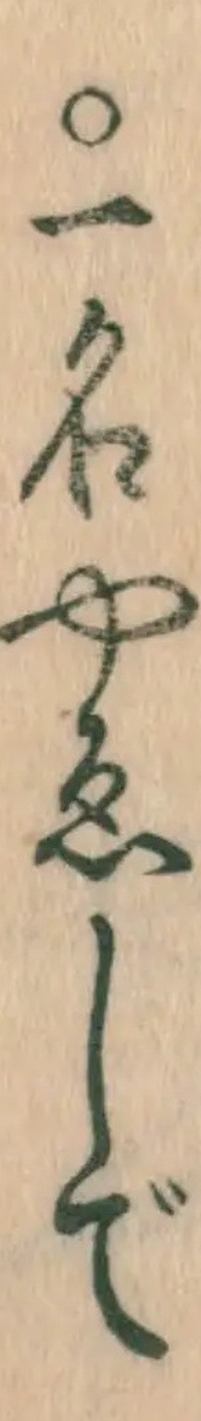○一名やゑしで
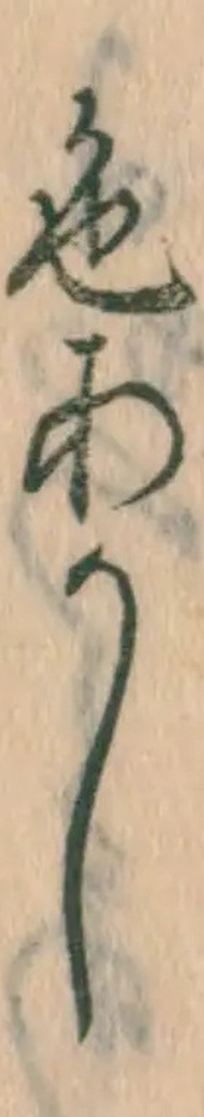色あかし
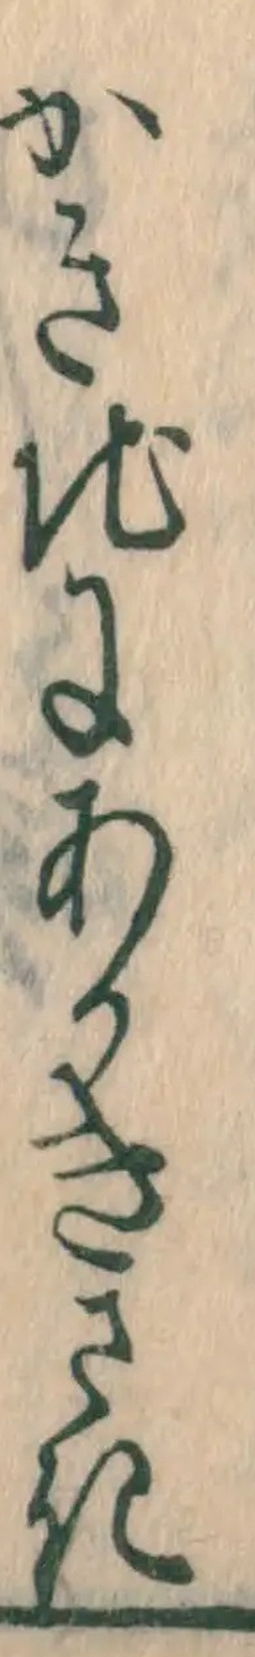かき地にあかきさき
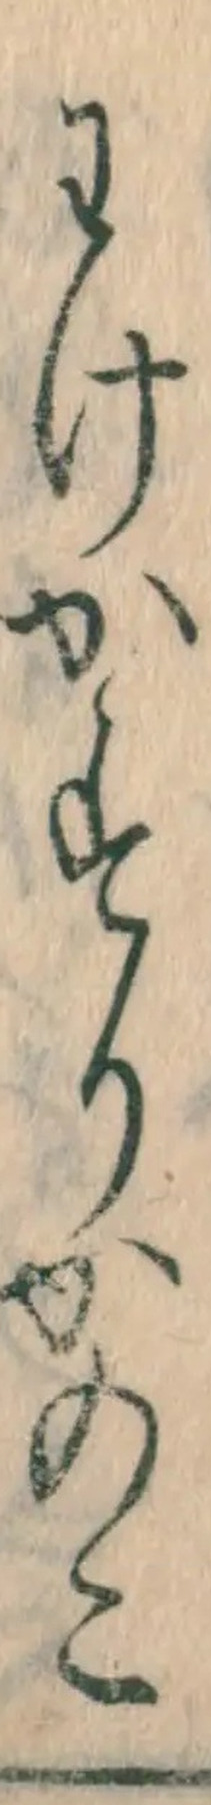わけかすりかのこ

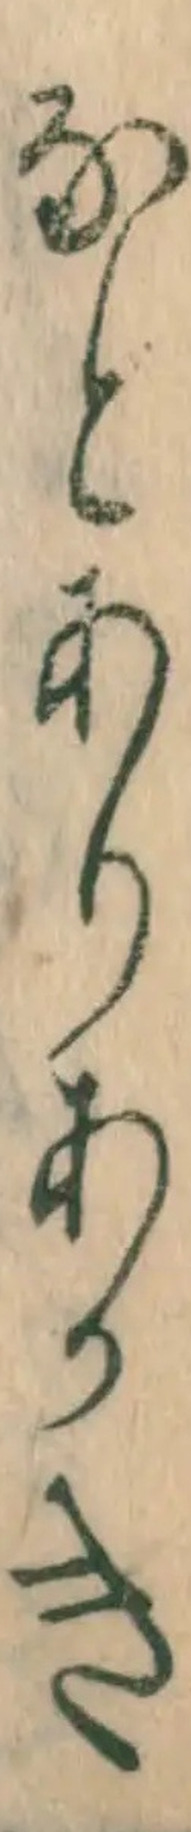などありあかき
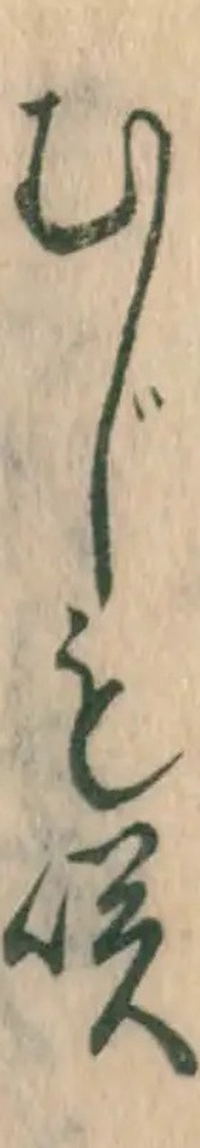むじも咲
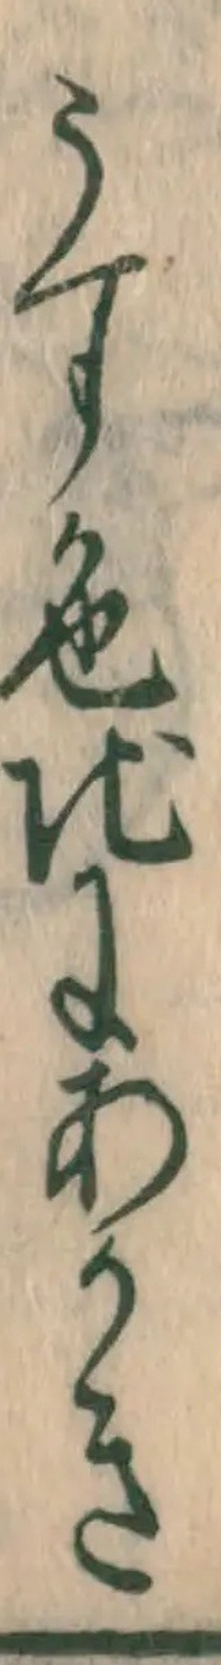うす色地にあかき
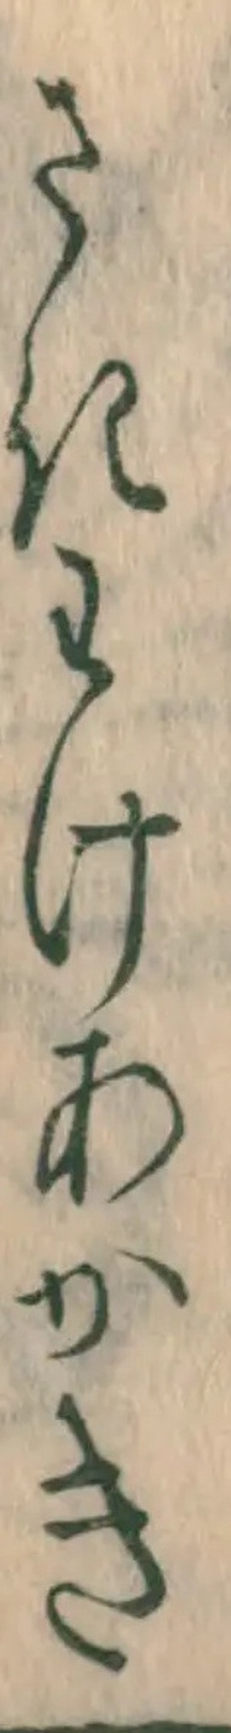さきわけあかき
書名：錦繍枕 5巻. [5]
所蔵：国立国会図書館 National Diet Library, JAPAN
